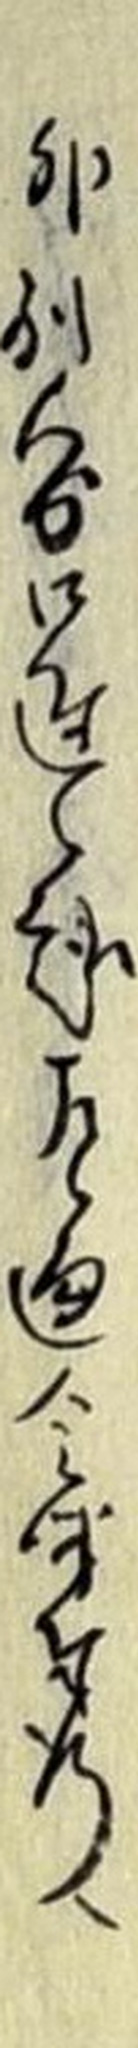外別紙口達之趣左之通金津奉行へ
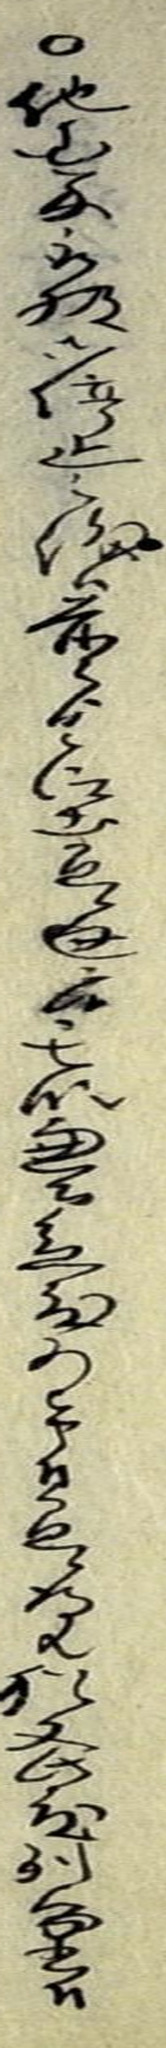〇他国米取扱御停止之儀ハ前々ゟ被仰出置候通ニ候其段兼而急度可被申付置候得共猶又此度別紙書付
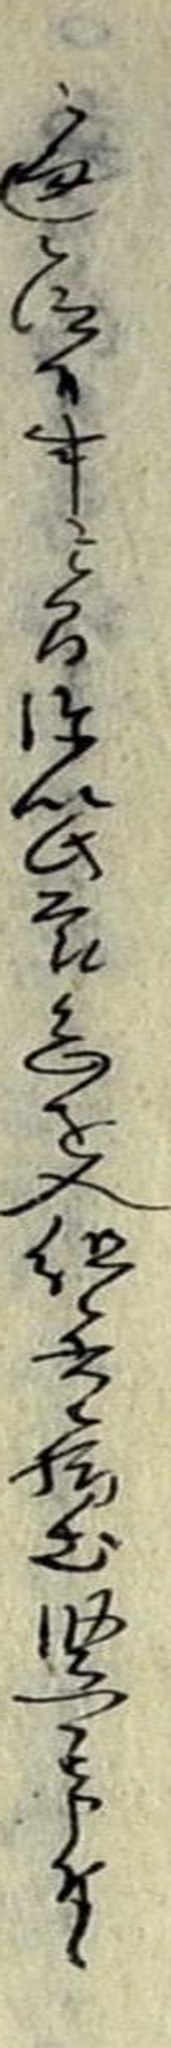之通被仰付事ニ候間弥以此節念を入組之者被指出堅可被申付候
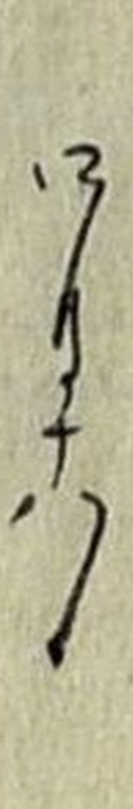四月十八日
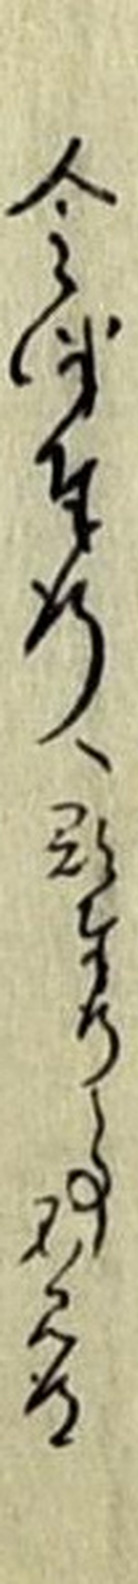金津奉行へ郡奉行之事不見得候
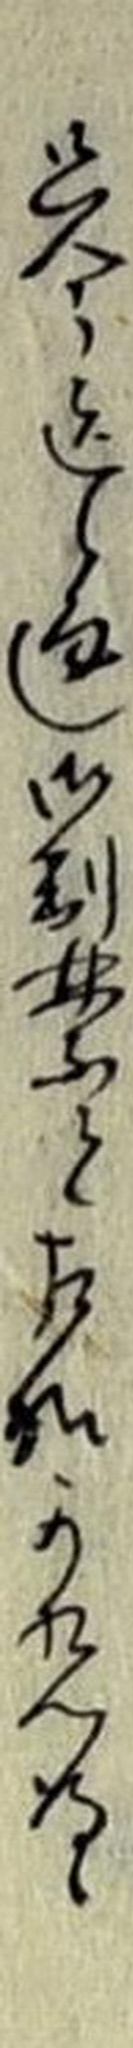只今迄之通御制業ニ候左様可被相心得候
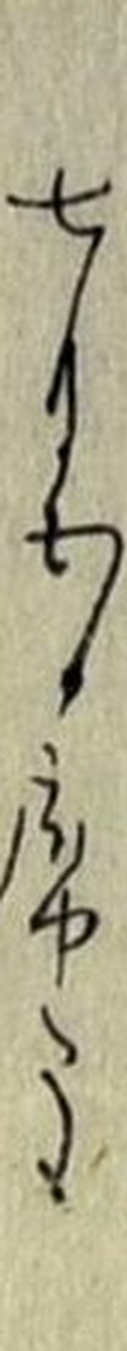七月五日府中へも
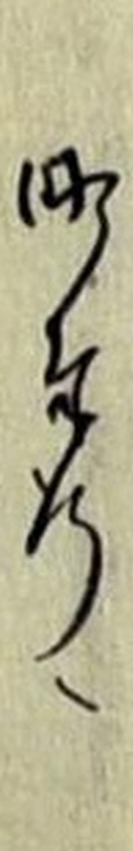町奉行へ
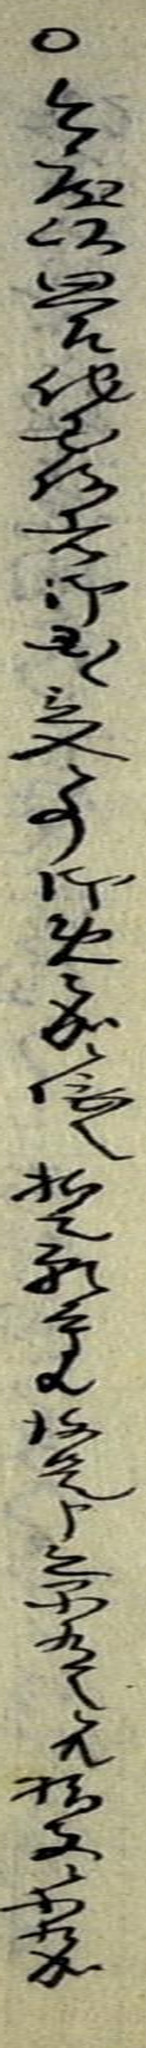〇今度以思召他国役者御国へ立入候事御免被成候依之誓願寺共彼是申立品有之候共指支ニ不相成
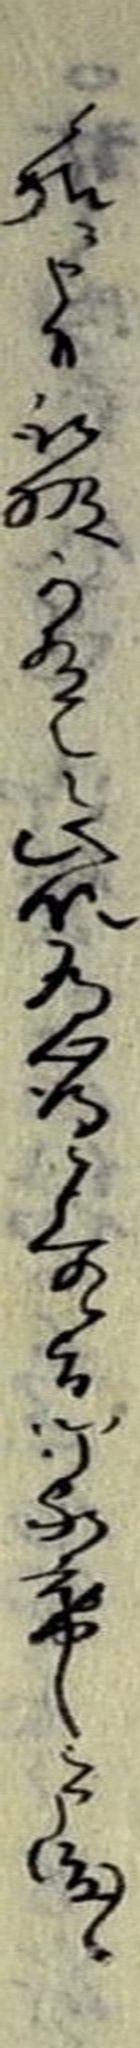候様ニ申付取扱可有之候此段為心得被申聞候旨御家老中被申渡候
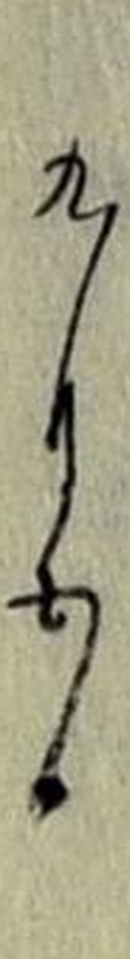九月五日
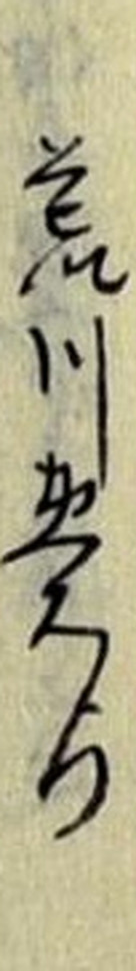荒川惣右衛門
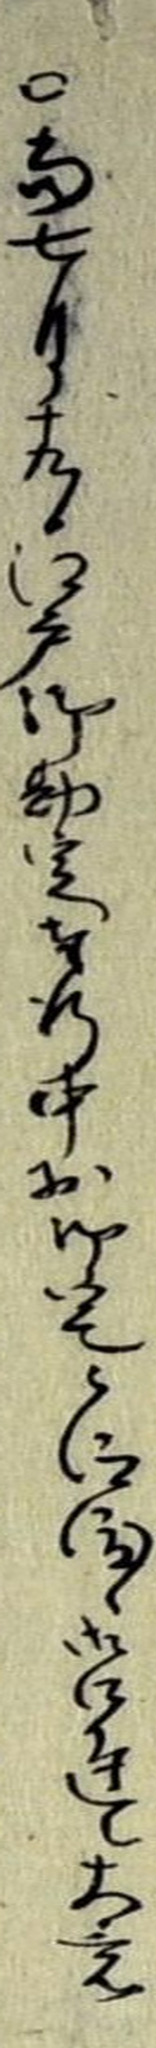〇当七月十九日江戸御勘定奉行中於御宅被仰渡候御口達之大意
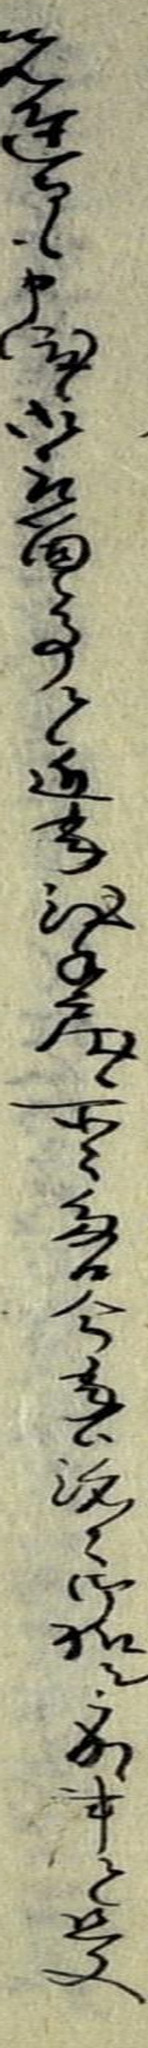先達而も申渡候御取箇之事ニ候近年致手戻候所々多候今年ハ銘々御様シ被成候事ニ候且又
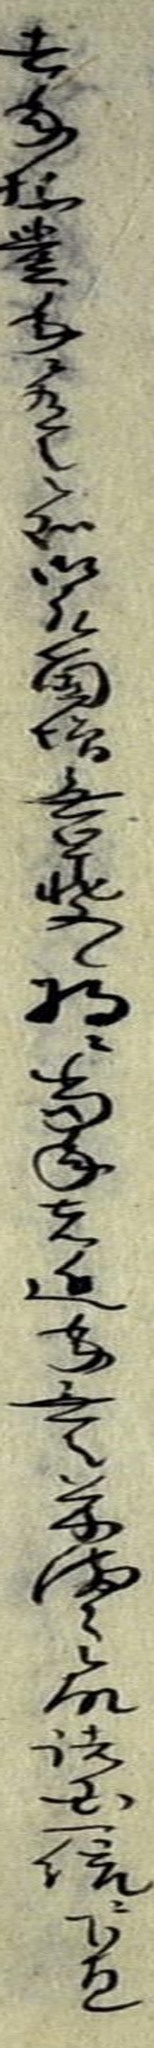去年抔豊年ニ有之候処御取箇増無候特ニ当年者近年無之米満々候故諸国一統ニ下直
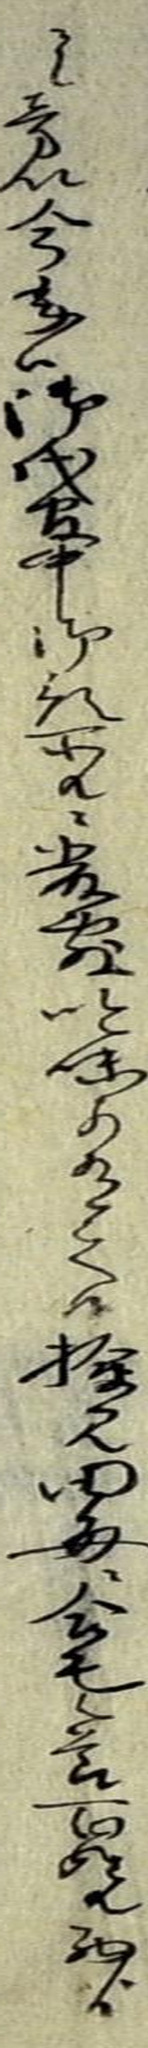ニ候旁以今年ハ御代官中御預所共ニ厳敷吟味も有之候検見田毎ニ食毛之節百姓共西ゟ
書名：命令之部 一
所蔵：福井県文書館 Fukui Prefectural Archives
